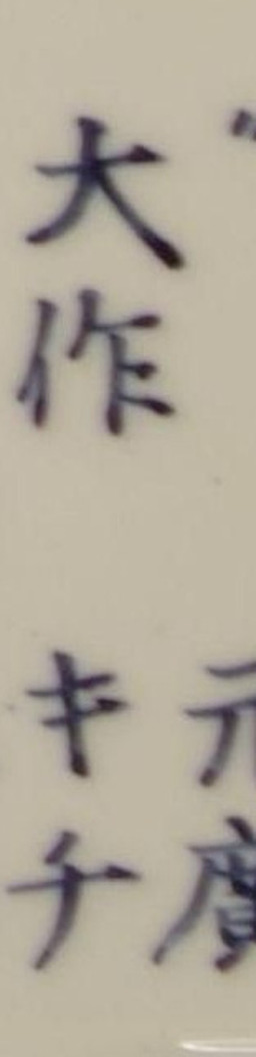大作キチ
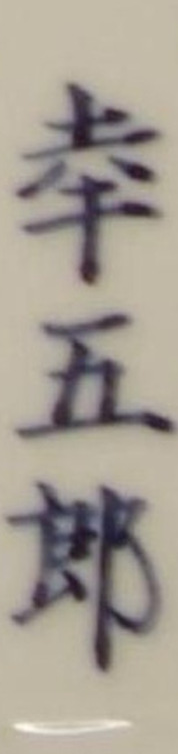幸五郎
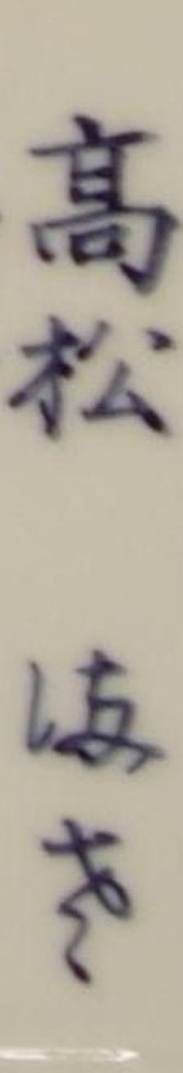高松まさ
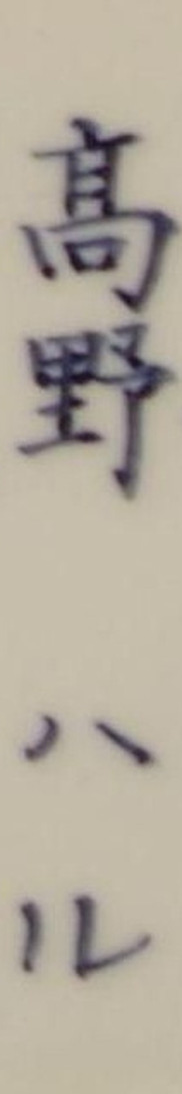高野ハル
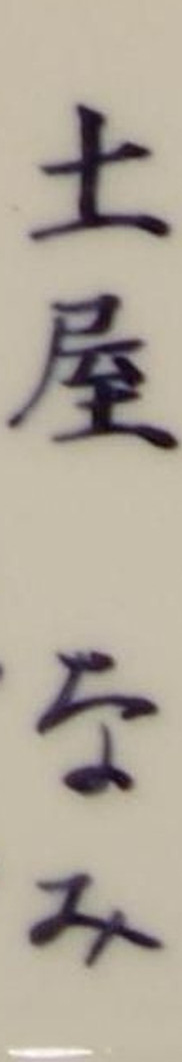土屋なみ
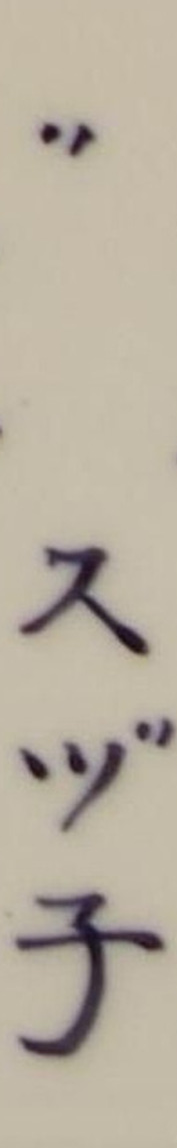スヅ子
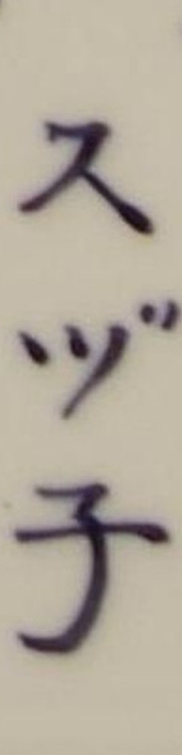スヅ子
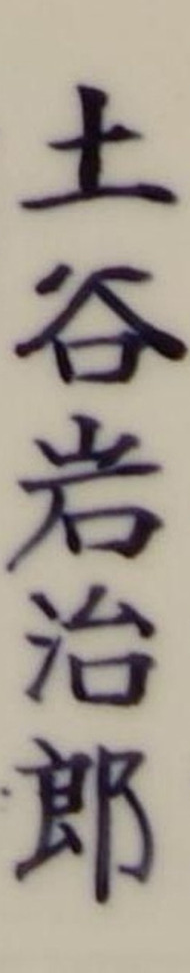土谷岩治郎
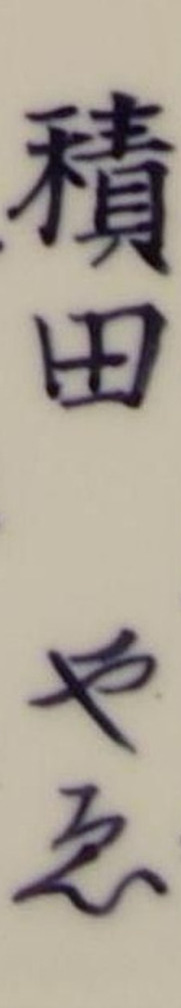積田やえ
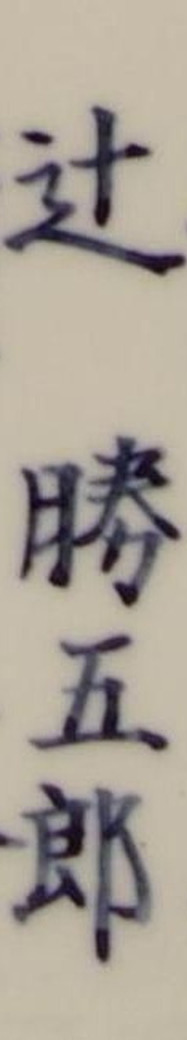辻勝五郎
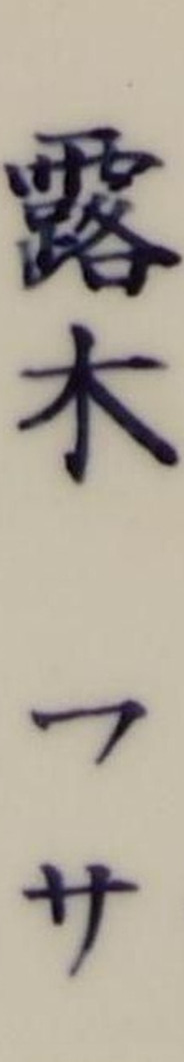露木フサ
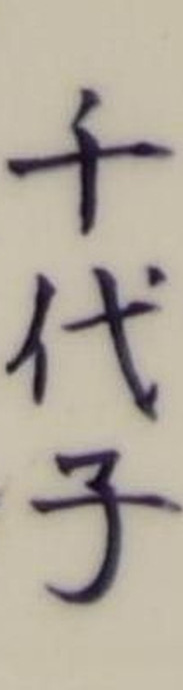千代子
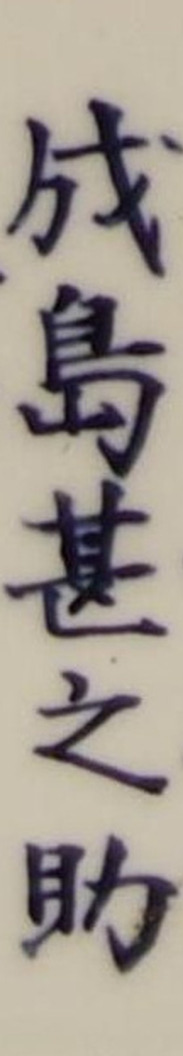成島甚之助

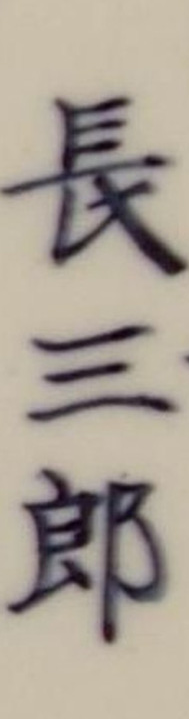長三郎
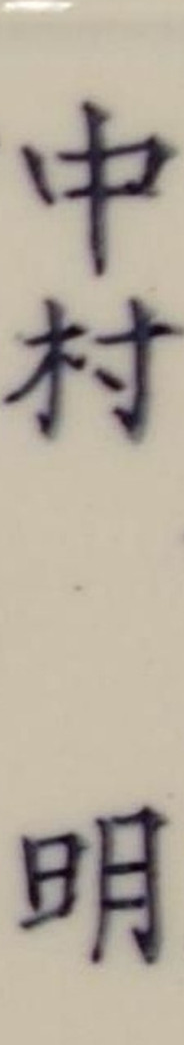中村明
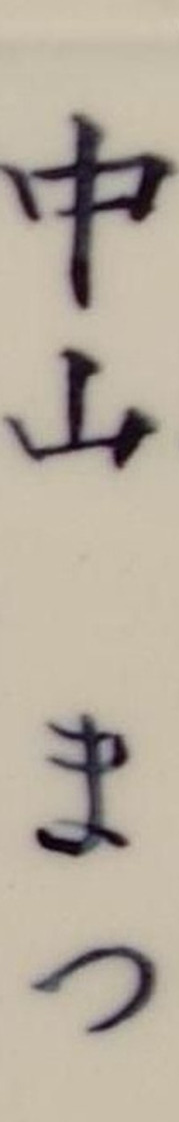中山まつ
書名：E~L
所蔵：高野山金剛峯寺
